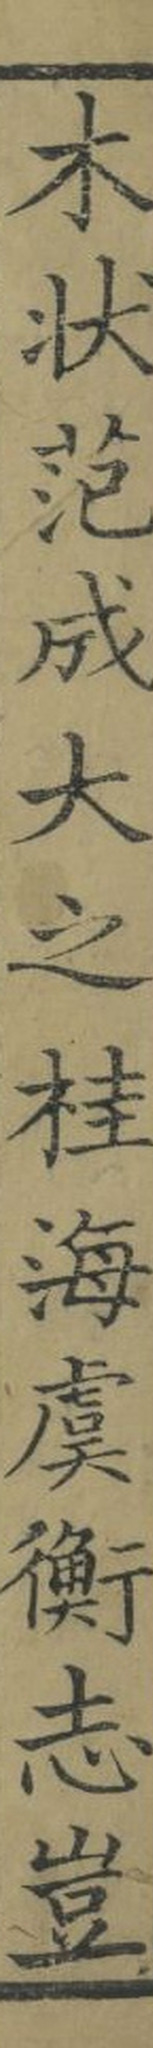木状范成大之桂海虞衡志豈
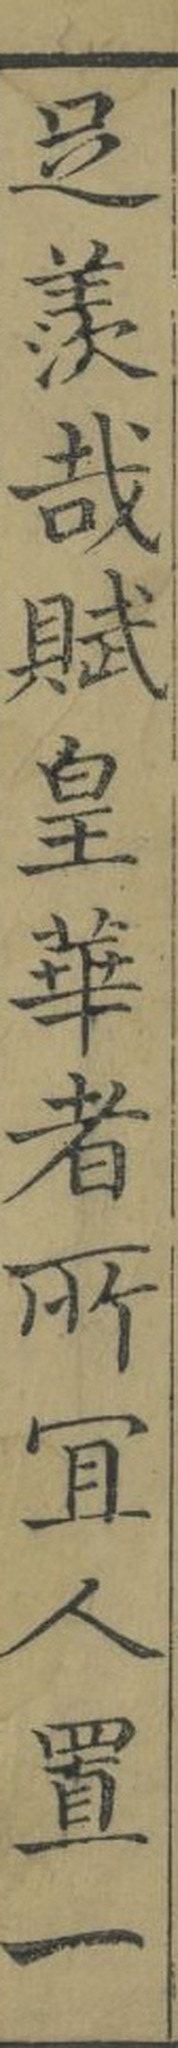足羡哉賦皇華者所冝人置一
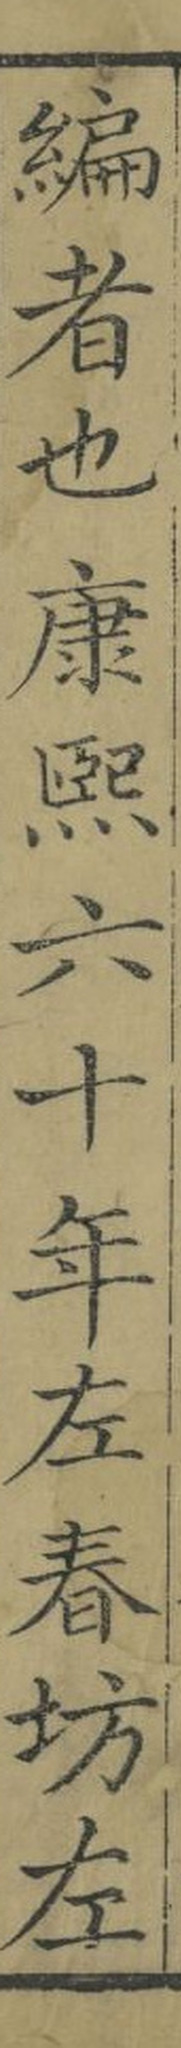編者也康熙六十年左春坊左
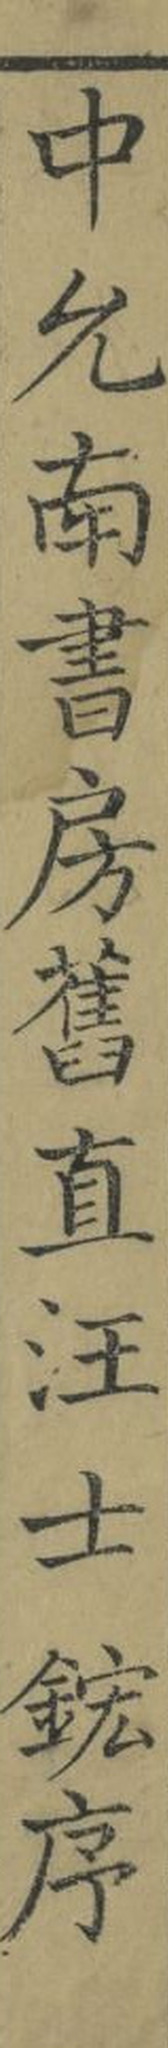中允南書房舊直汪士鋐序

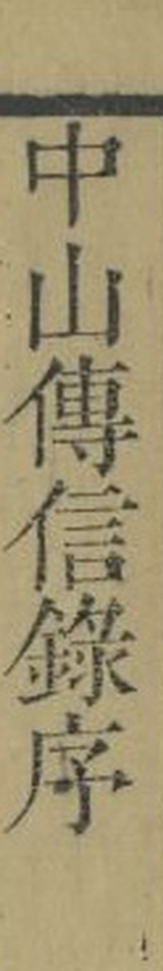中山傳信錄序
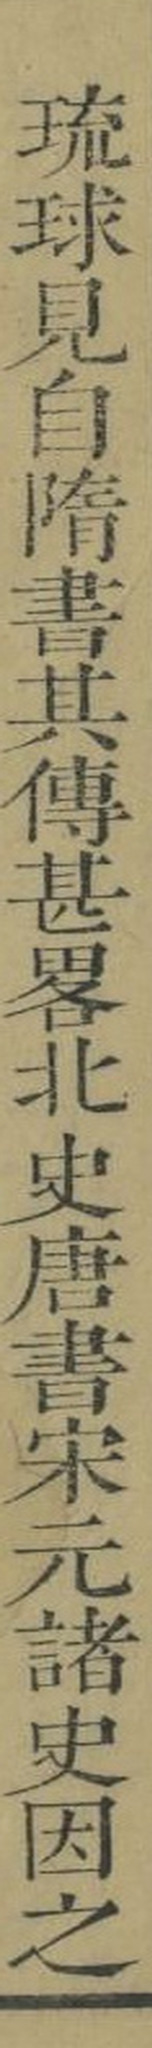琉球見自隋書其傳甚畧北史唐書宋元諸史因之
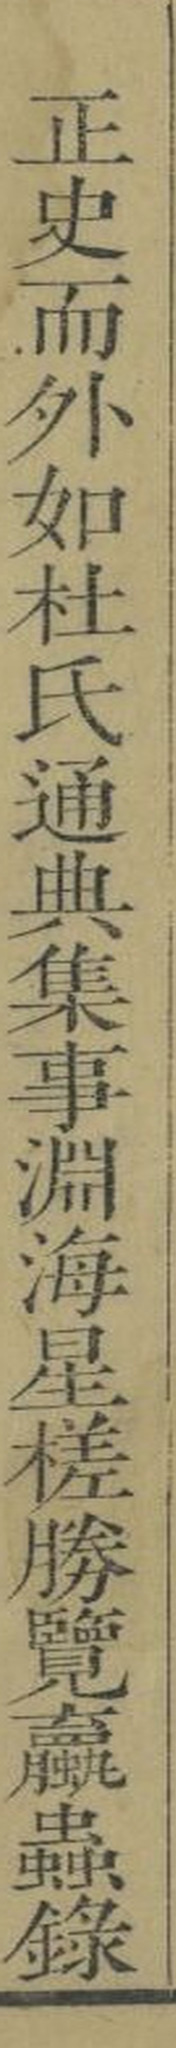正史而外如杜氏通典集事淵海星槎勝覽蠃蟲錄
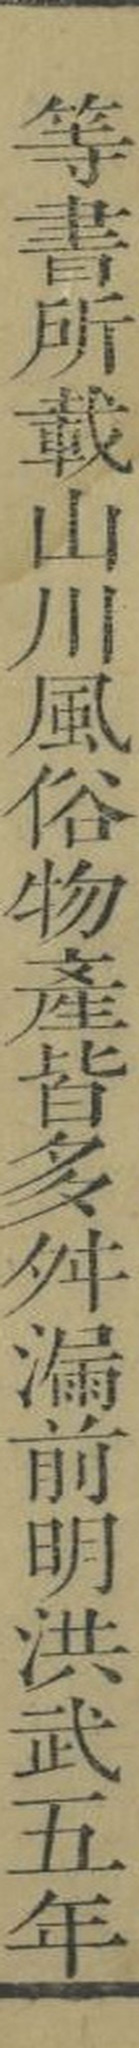等書所載山川風俗物產皆多舛漏前明洪武五年
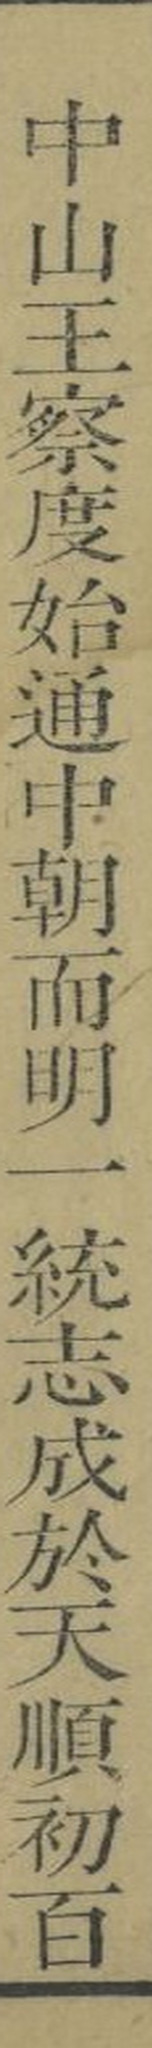中山王察度始通中朝而明一統志成於天順初百
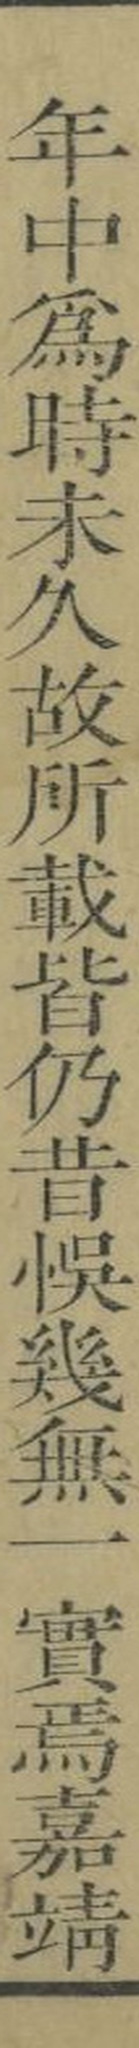年中爲時未久故所載皆仍昔悞幾無一實焉嘉靖
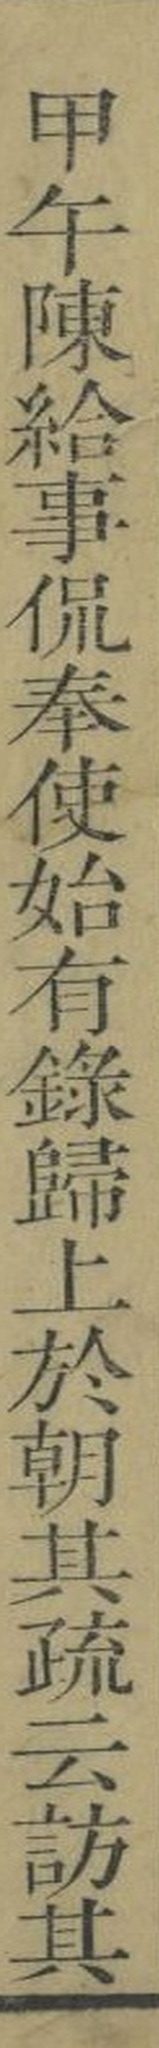甲午陳給事侃奉使始有錄歸上於朝其疏云訪其
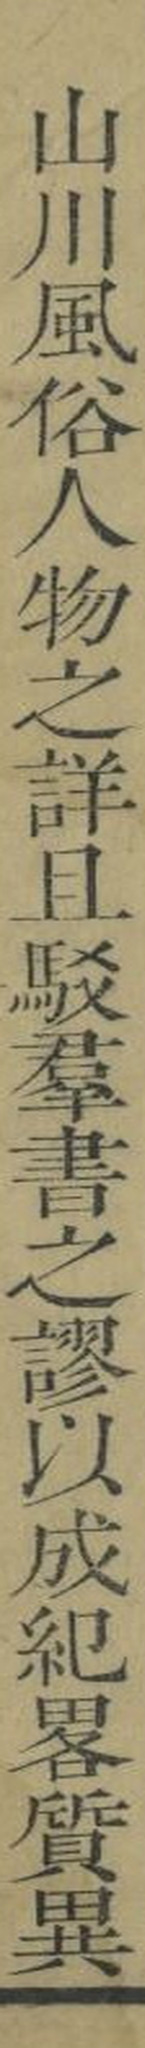山川風俗人物之詳且駁羣書之謬以成紀畧質異
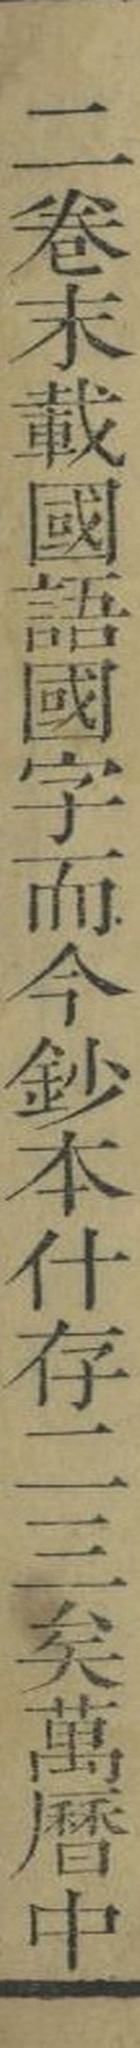二卷末載國語國字而今鈔本什存二三矣萬曆中

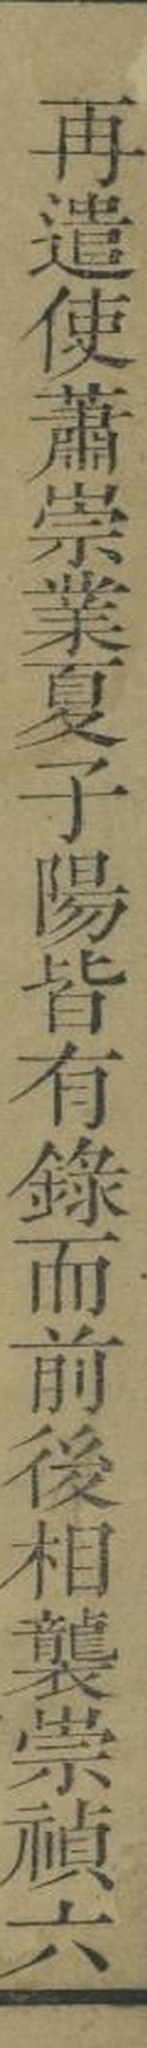再遣使蕭崇業夏子陽皆有錄而前後相襲崇禎六
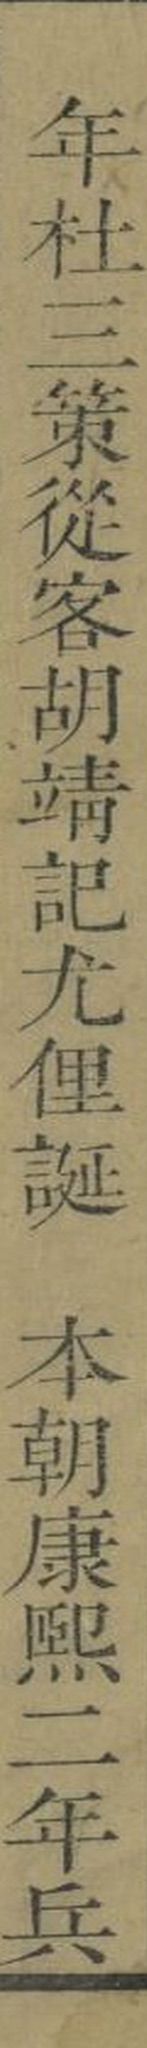年杜三策從客胡靖記尤俚誕本朝康熙二年兵
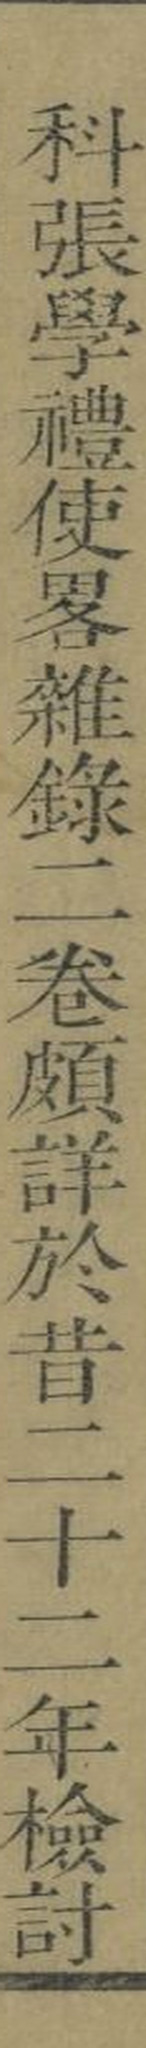科張學禮使畧雜錄二卷頗詳於昔二十二年檢討
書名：中山伝信録 巻一
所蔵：University of the Ryukyus Library
